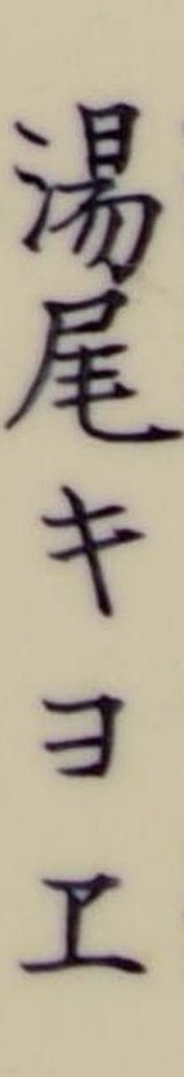湯尾キヨヱ
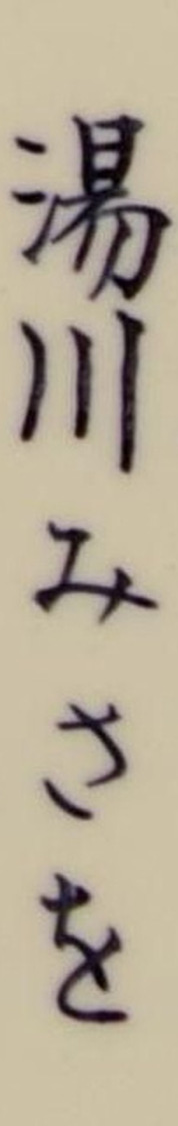湯川みさを
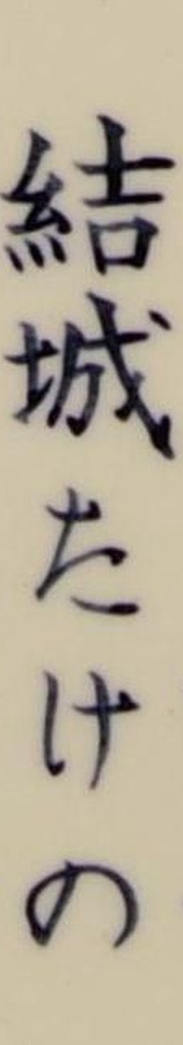結城たけの
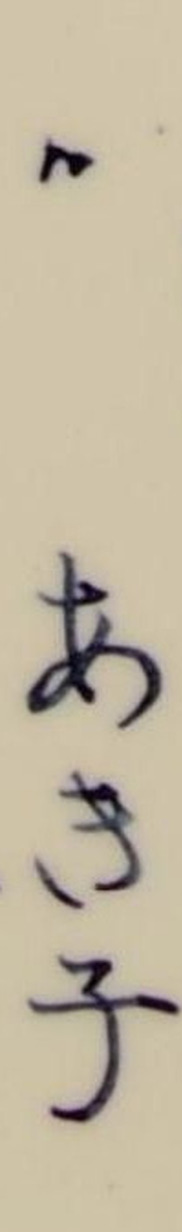あき子
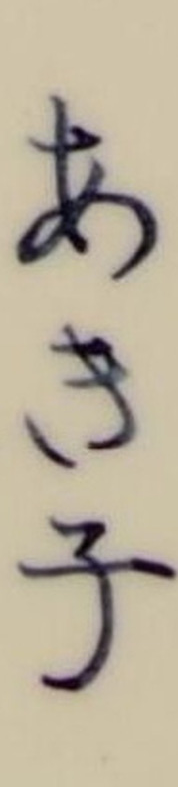あき子
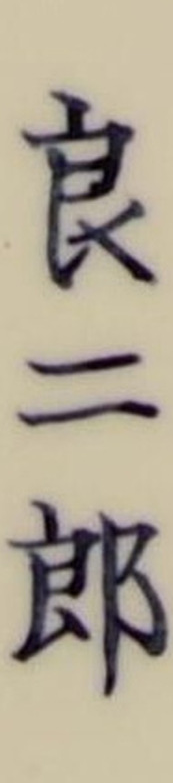良二郎
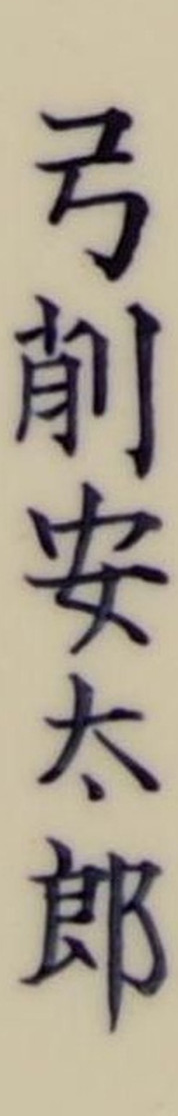弓削安太郎
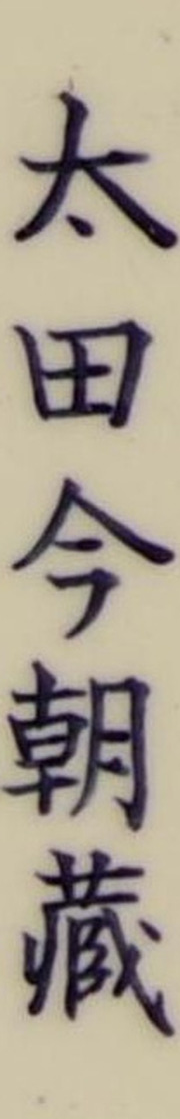太田今朝蔵
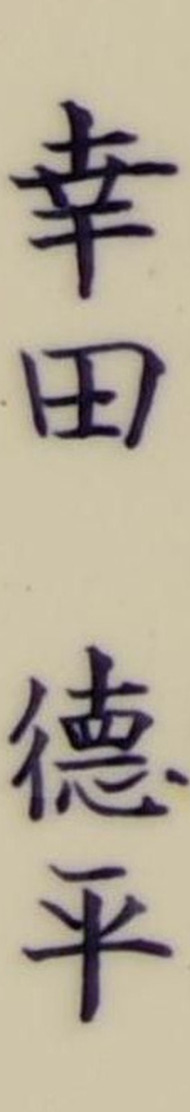幸田徳平
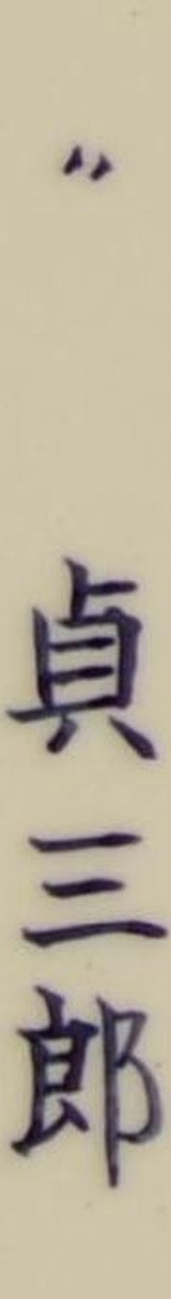貞三郎
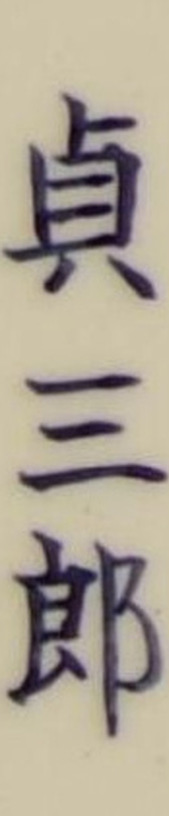貞三郎
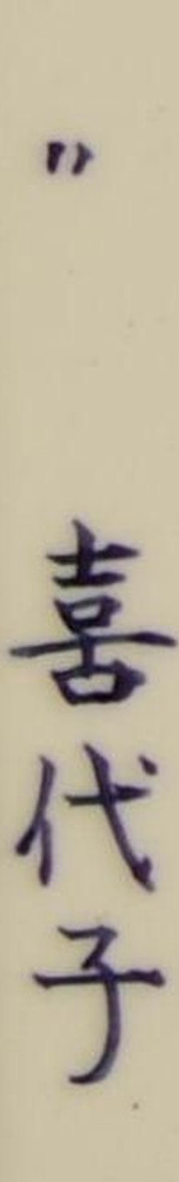喜代子
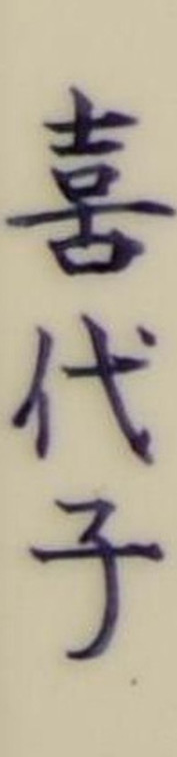喜代子

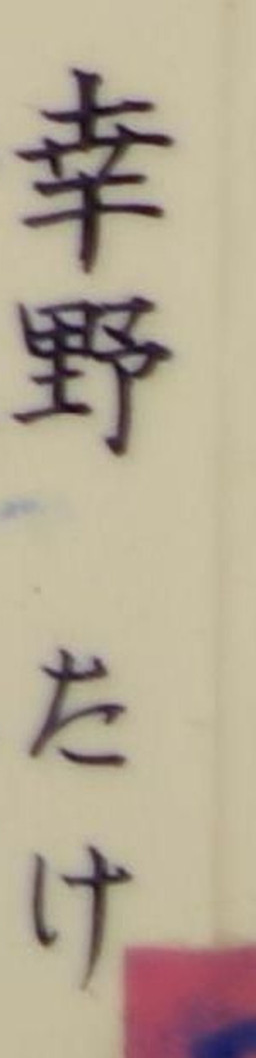幸野たけ
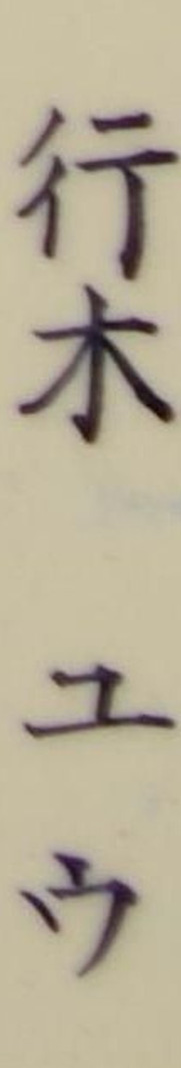行木ユウ
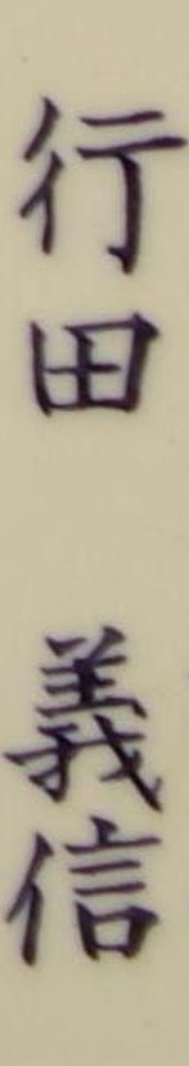行田義信
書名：E~L
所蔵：高野山金剛峯寺
